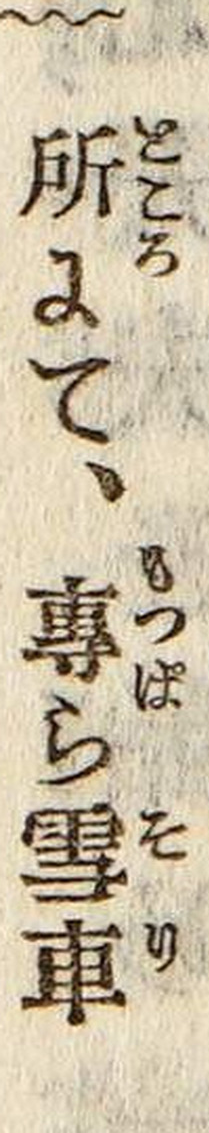所にて、専ら雪車
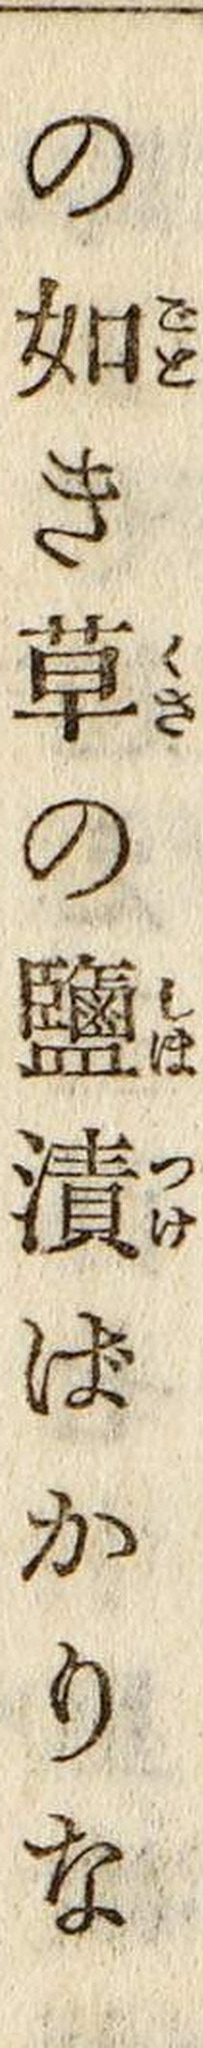の如き草の塩漬ばかりな
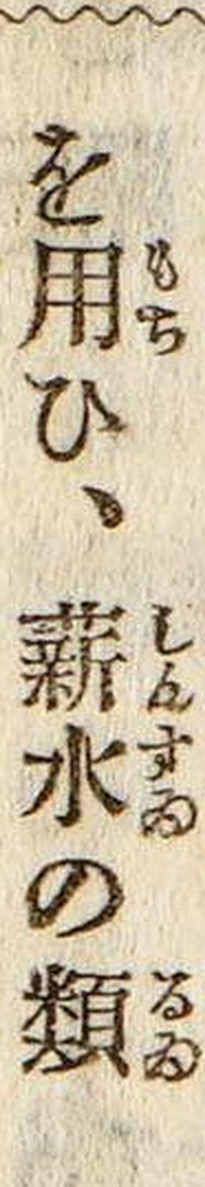を用ひ、薪水の類
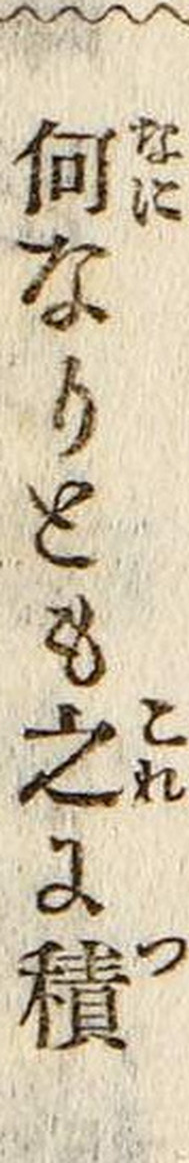何なりとも之に積
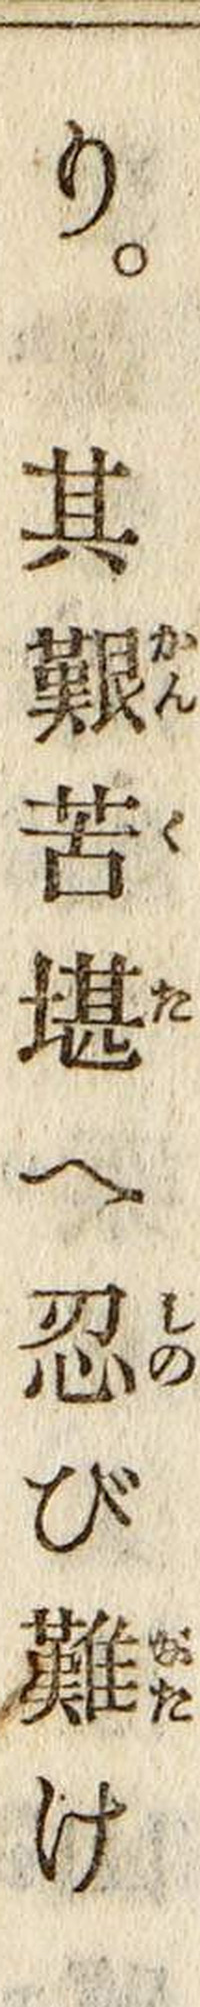り。其艱苦堪へ忍び難け
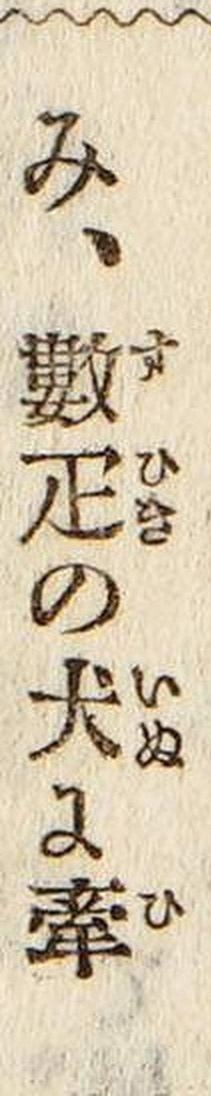み、数疋の犬に牽
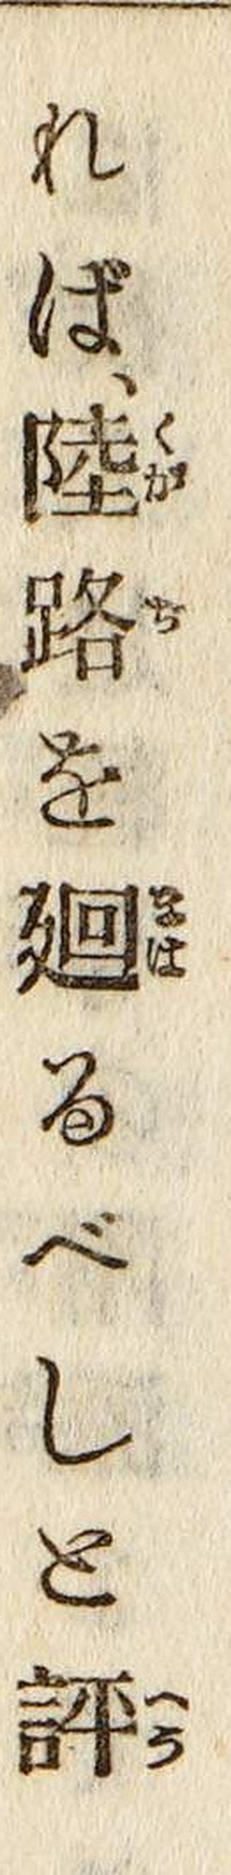れば、陸路を廻るべしと評
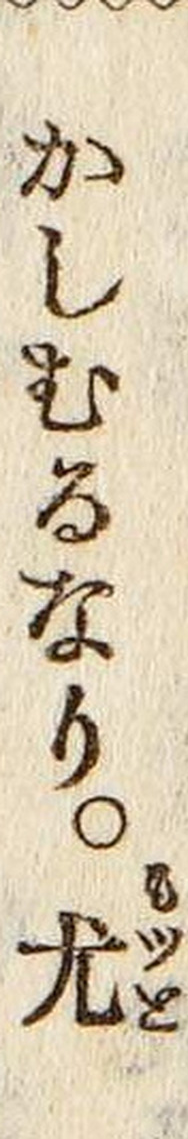かしむるなり。尤
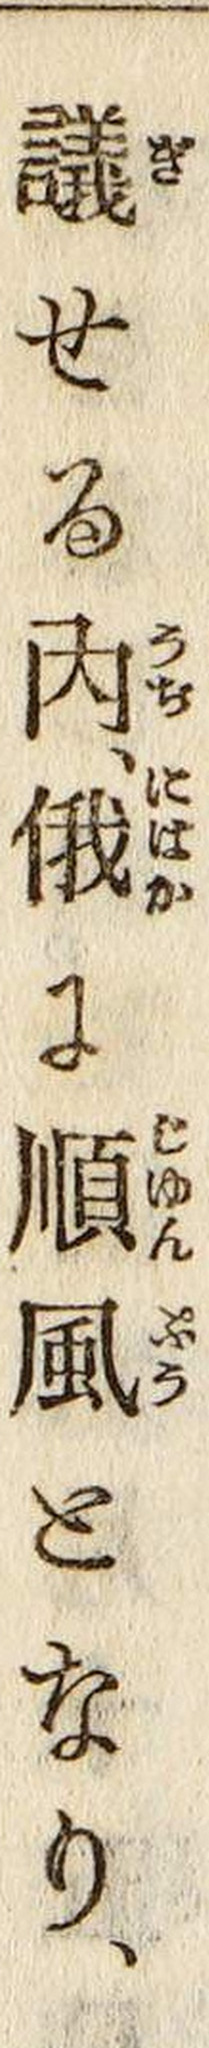議せる内、俄に順風となり
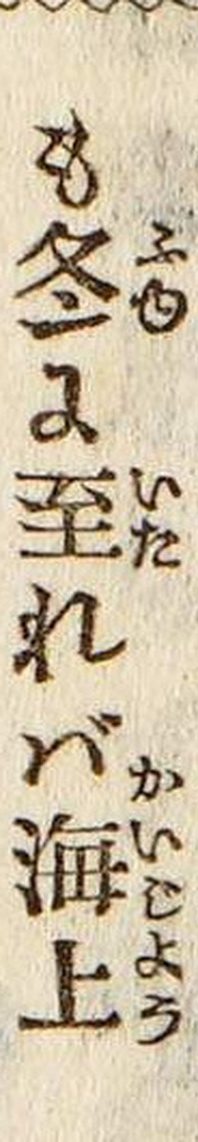も冬に至れバ海上
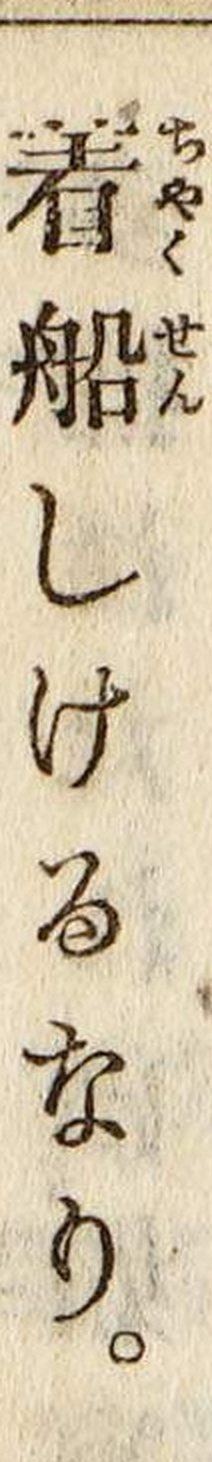着船しけるなり。
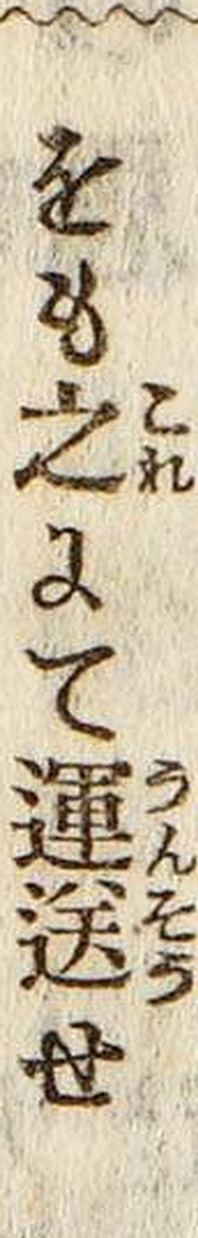をも之にて運送せ
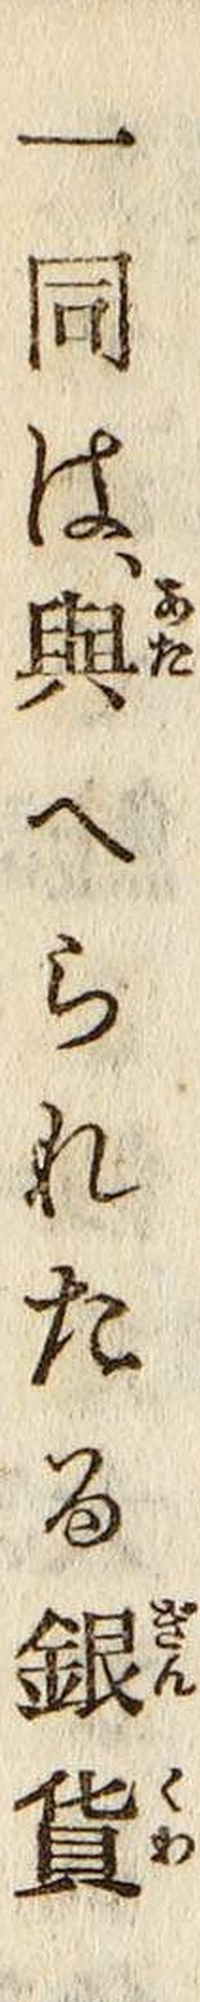一同は与へられたる銀貨
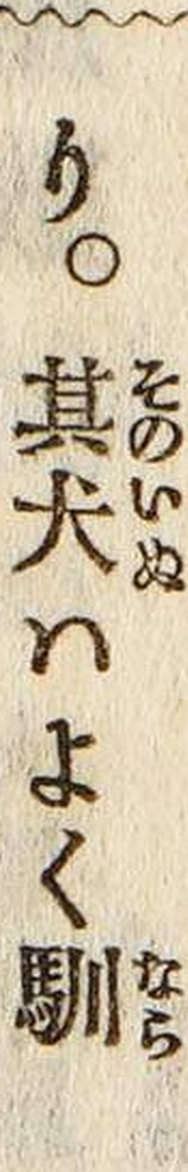り。其犬ハよく馴
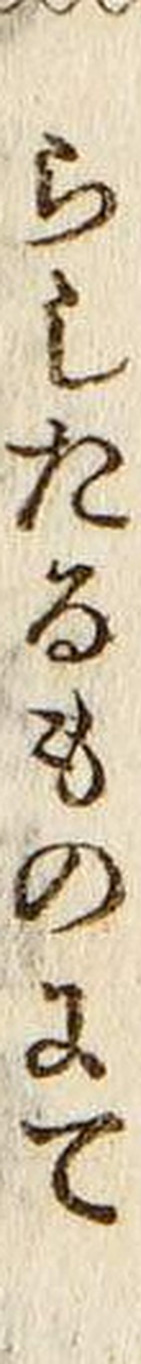らしたるものにて
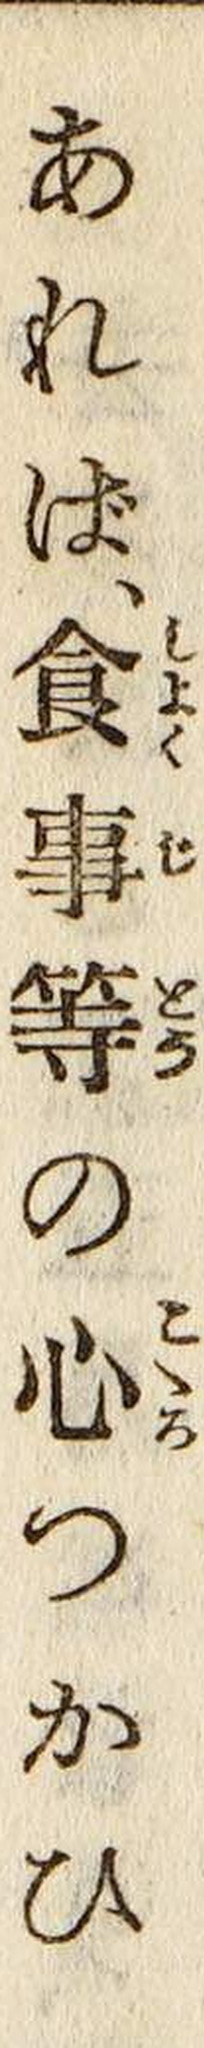あれば、食事等の心つかひ
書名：日本漂流譚
